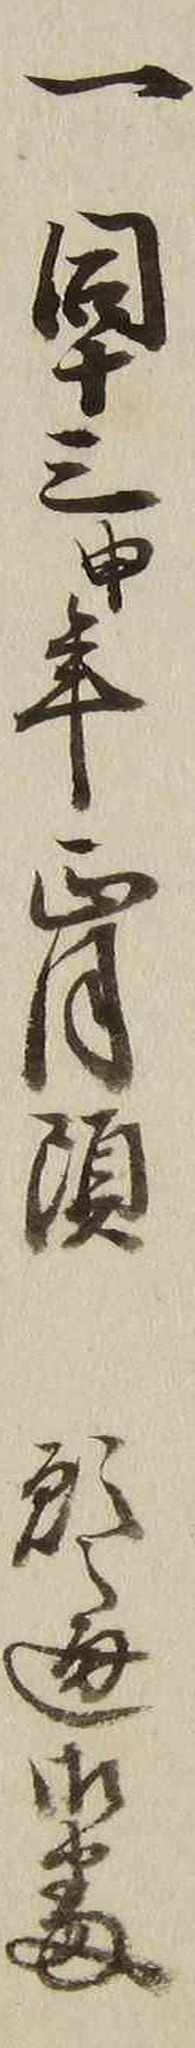一同十三申年正月頭願之通御番
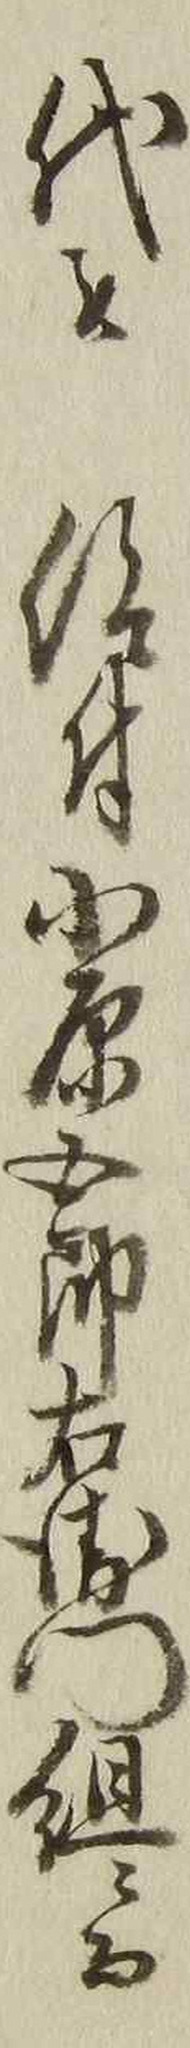代被仰付小原五郎右衛門組ニ而
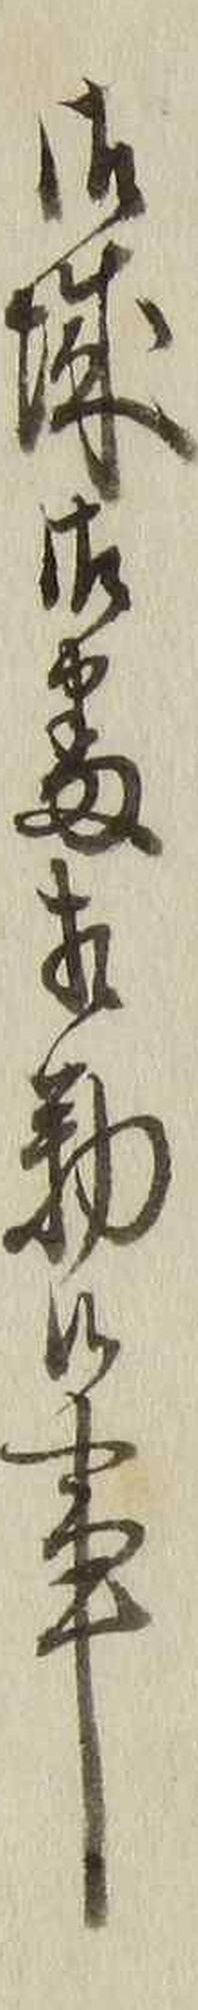御城御番相勤候事
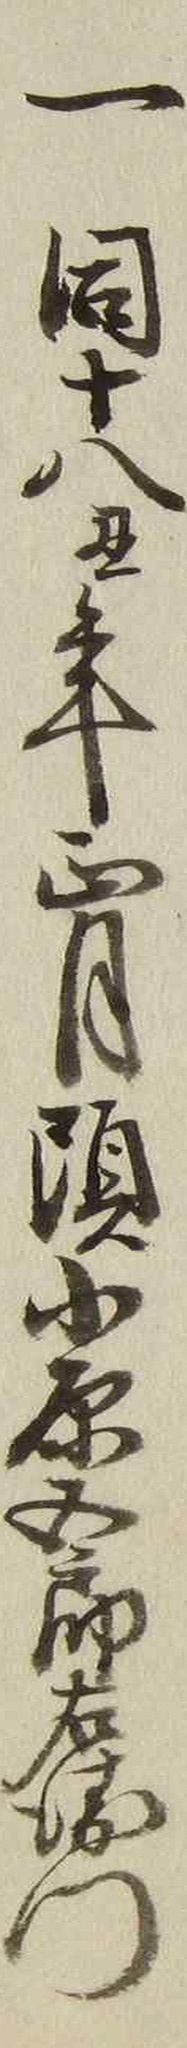一同十八丑年四月頭小原五郎右衛門
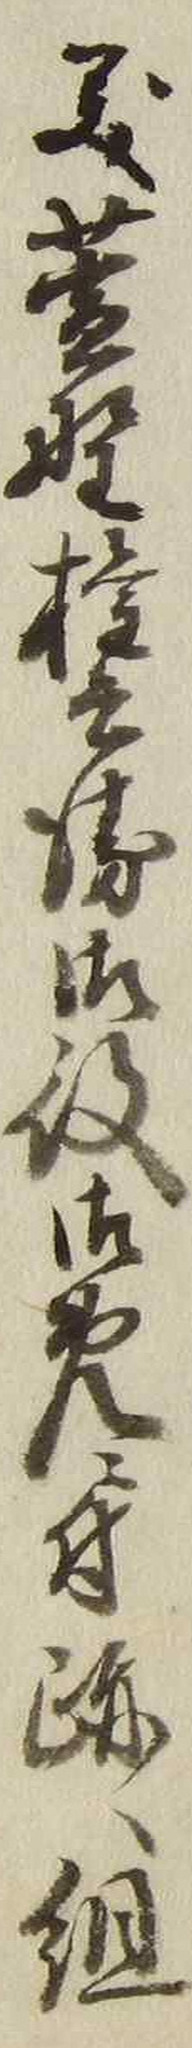義萱野権兵衛御役御免ニ付跡へ組
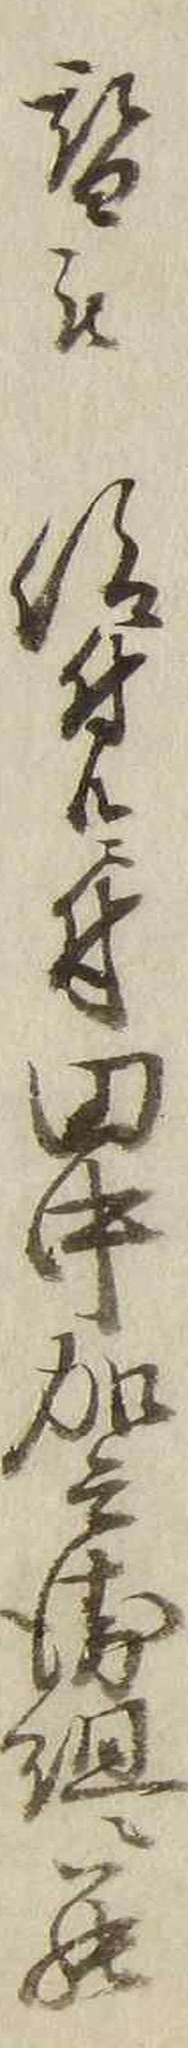替被仰付候ニ付田中加兵衛組ニ罷
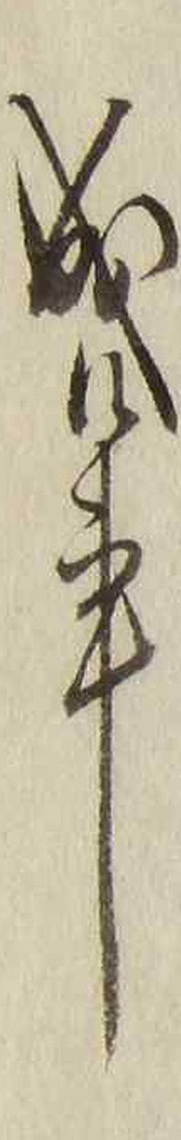成候事

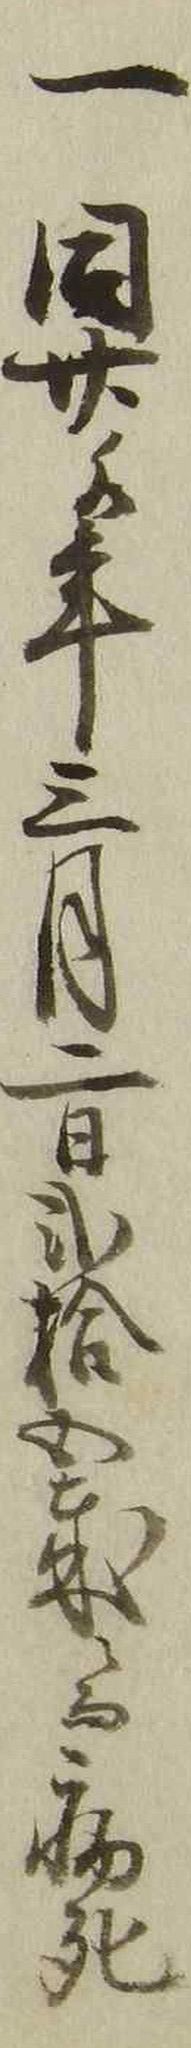一同廿卯年三月二日弐拾五歳ニ而病死
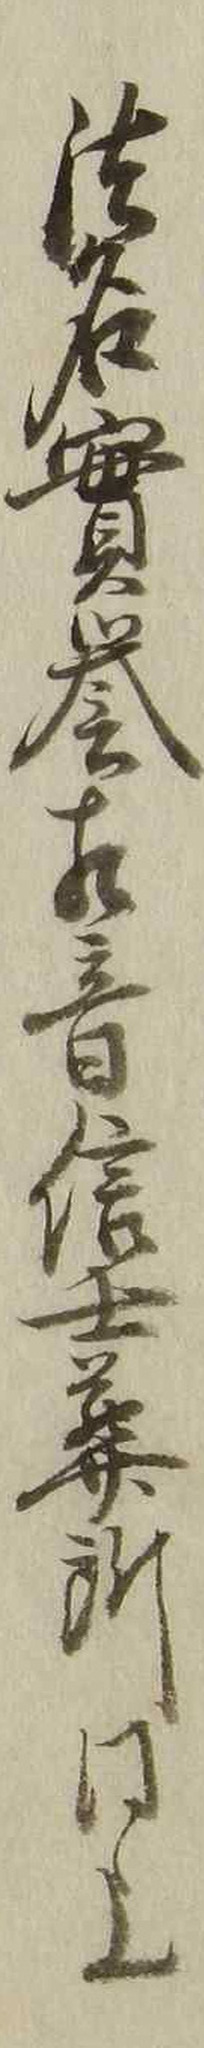法名実誉相音信士葬所同上
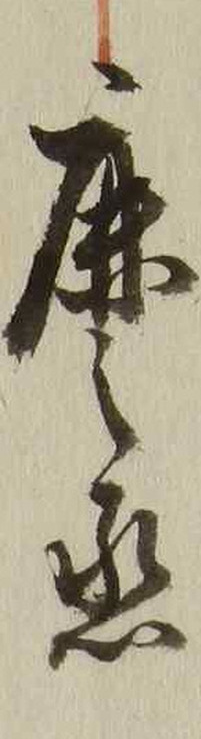廉之丞
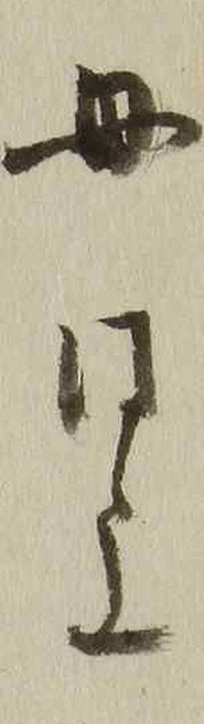母同上
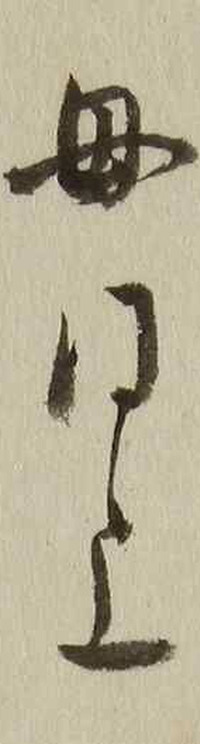母同上
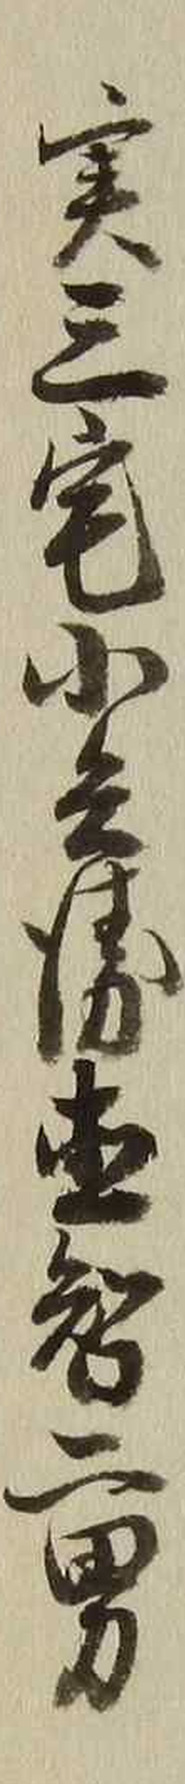実三宅小兵衛直智二男
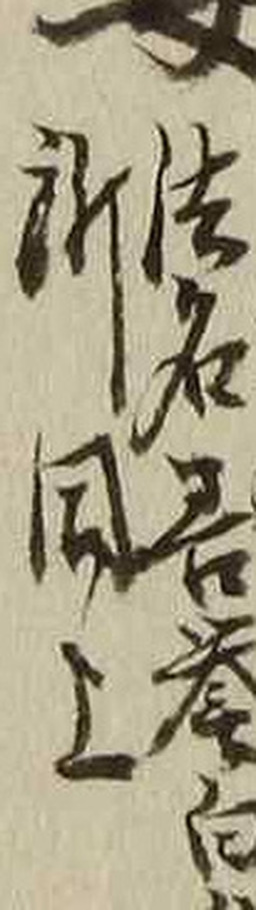母同上
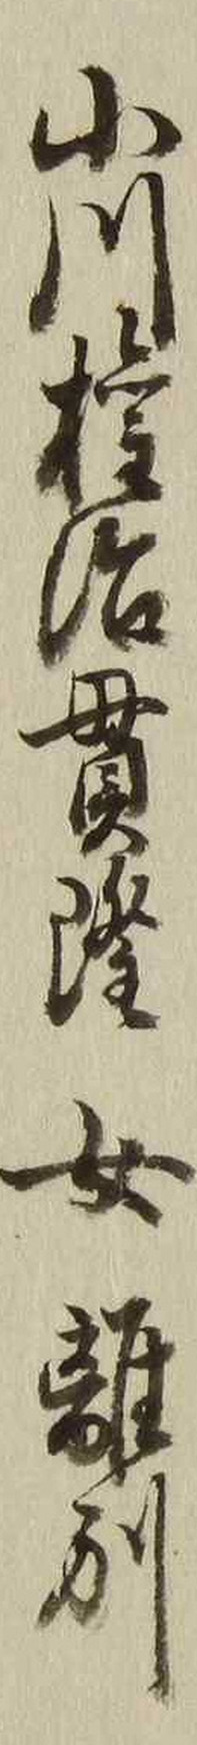小川権治貫隆女離別
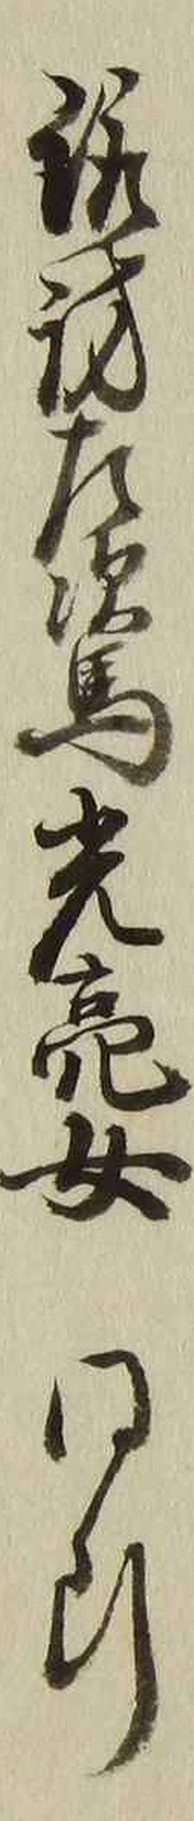諏訪左次馬光亮女同断
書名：諸士系譜　巻之53　に之部4
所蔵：会津若松市立会津図書館
